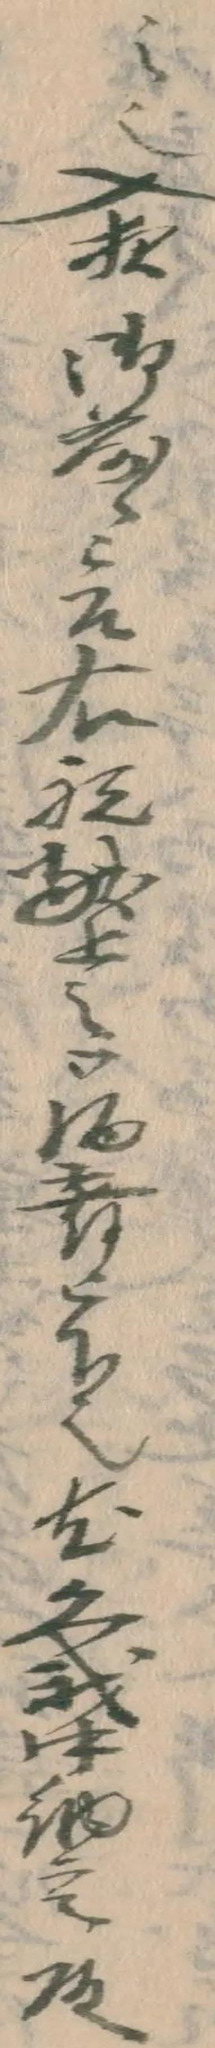之也入夜御前へ被召右祝献上之御酒肴被下也尤久我中納言殿
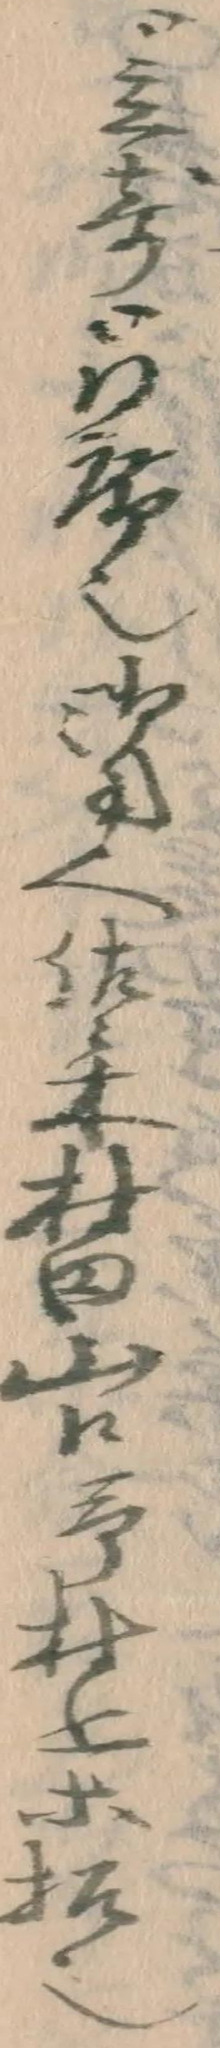御立寄御同席也御用人佐々木村田山口予村上等招也
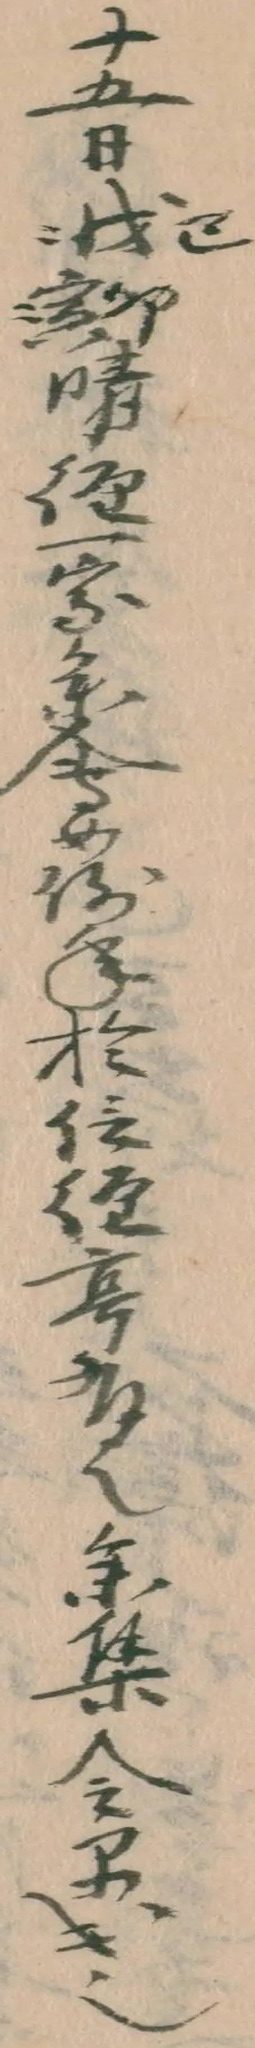十五日己寅晴経一家参會如例年於従経亭有之参集令早出也
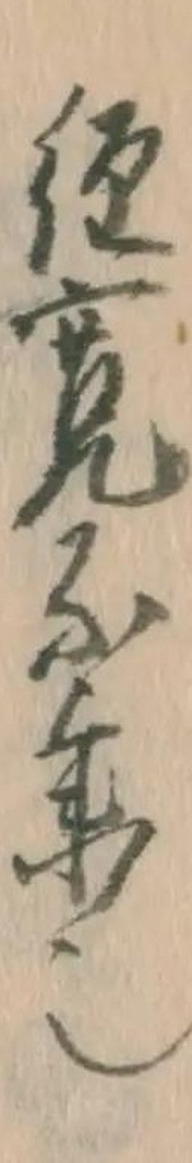経寛不参也
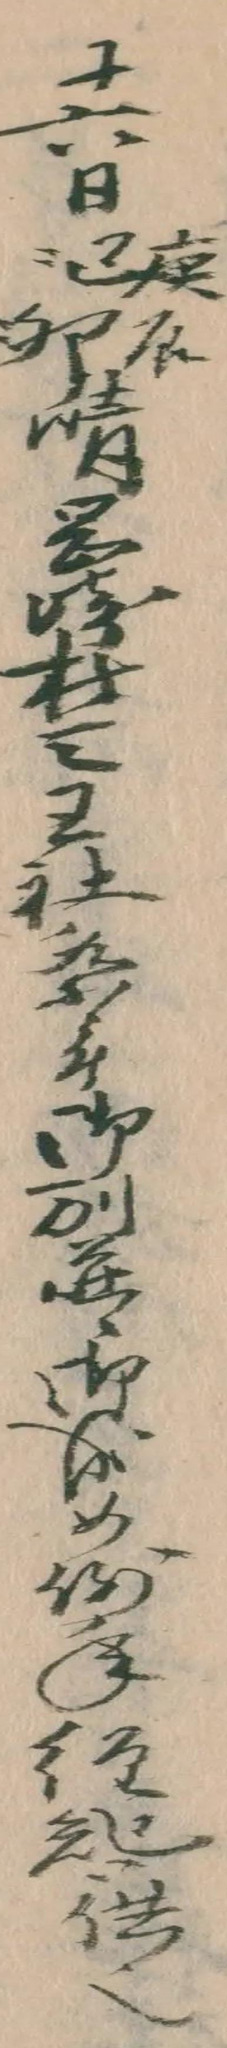十六日庚辰晴岡崎村天王社祭ニ付御別荘へ御成如例年経紀御供也
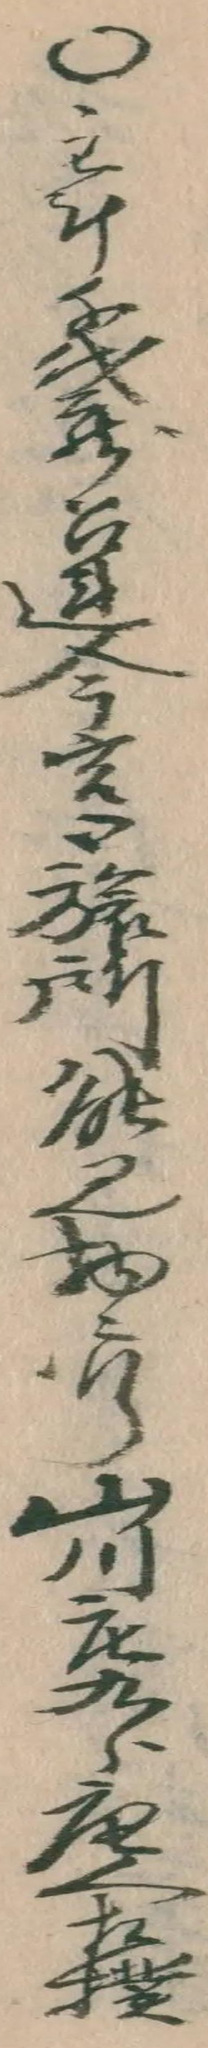○主斗千代蔵召連今宮御旅所能見物ニ行山川庄九郎唐人相撲
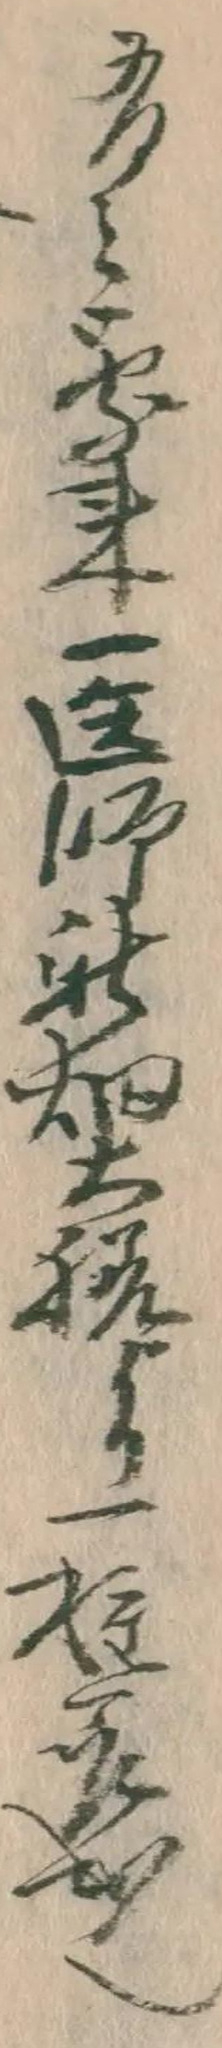有之御家来医師新畑大膳より一種差出候
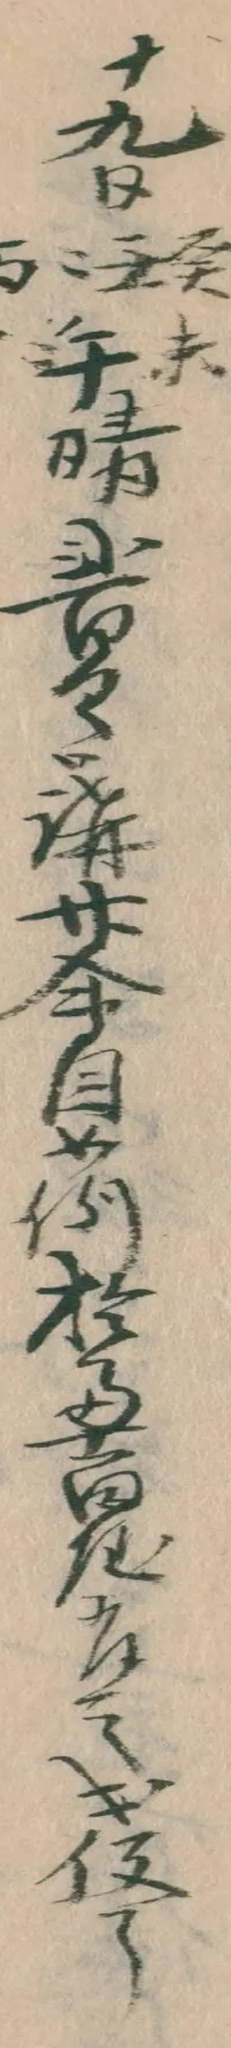十九日癸未晴弐百匁御講廿會目如例於奥田屋有之出役了
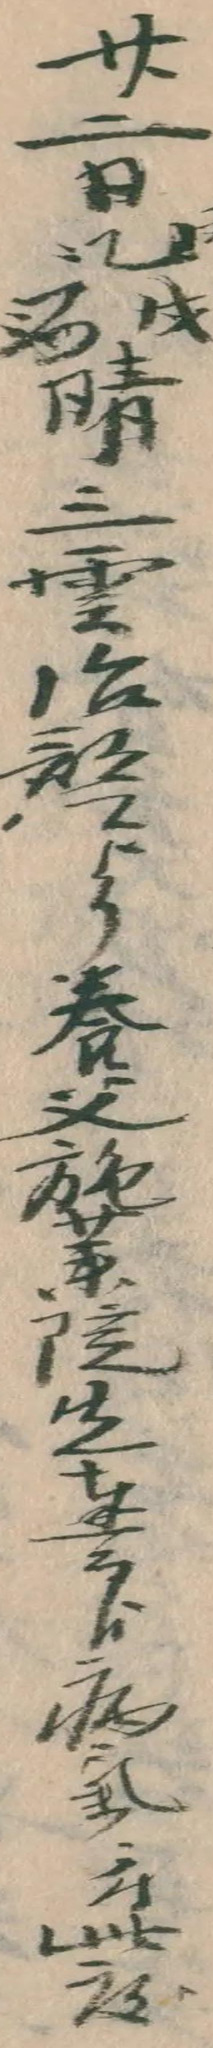廿二日丙戌晴三雲治部卿より養父施薬院先達而ゟ病氣ニ付此度
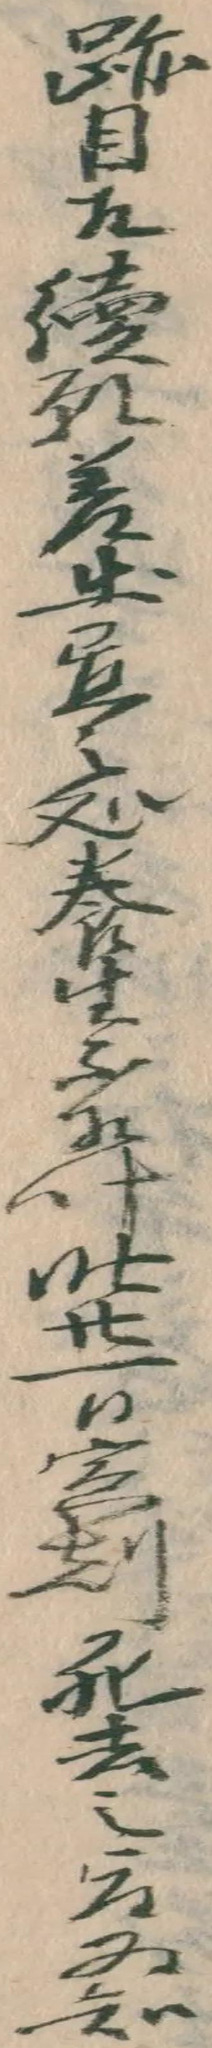跡目左續願差出置之処養生不相叶昨廿一日寅刻死去之旨為知
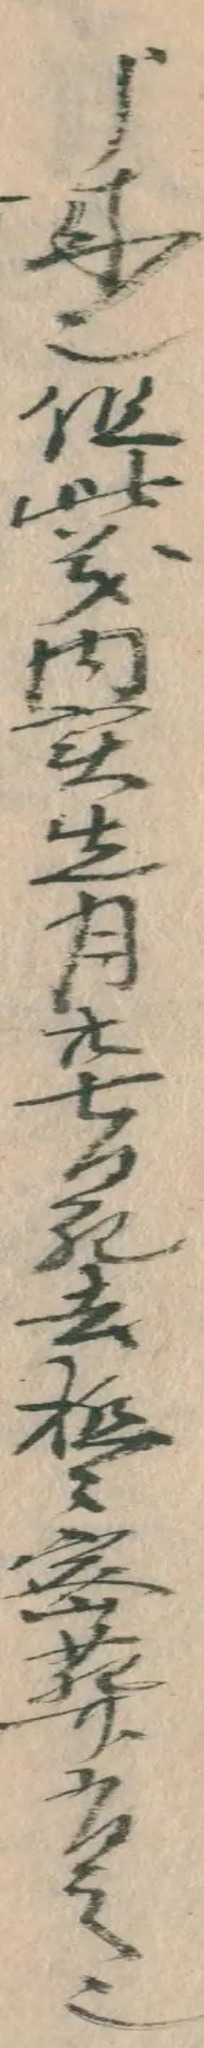申来也但此義内実先月廿七日死去極々密葬有之也
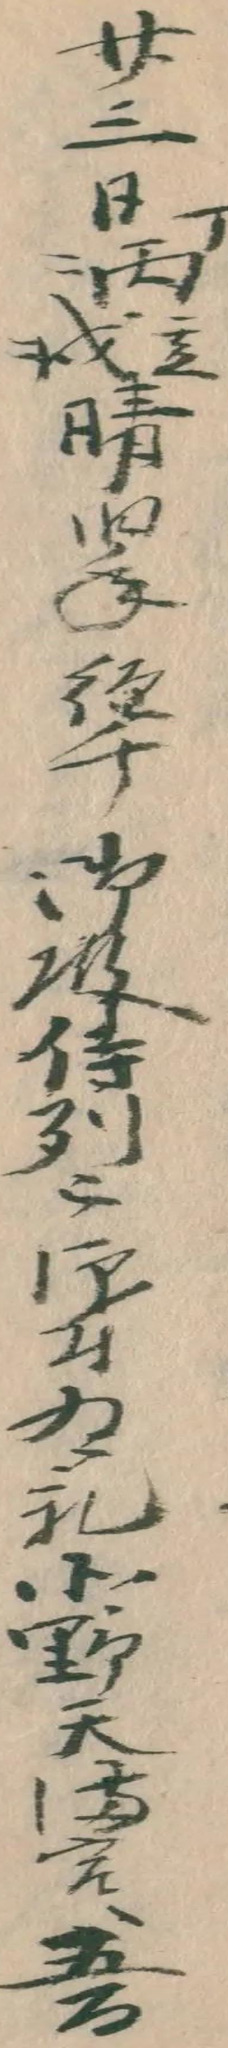廿三日丁亥晴旧年経千御殿侍列被仰付為御礼北野天満宮へ五百
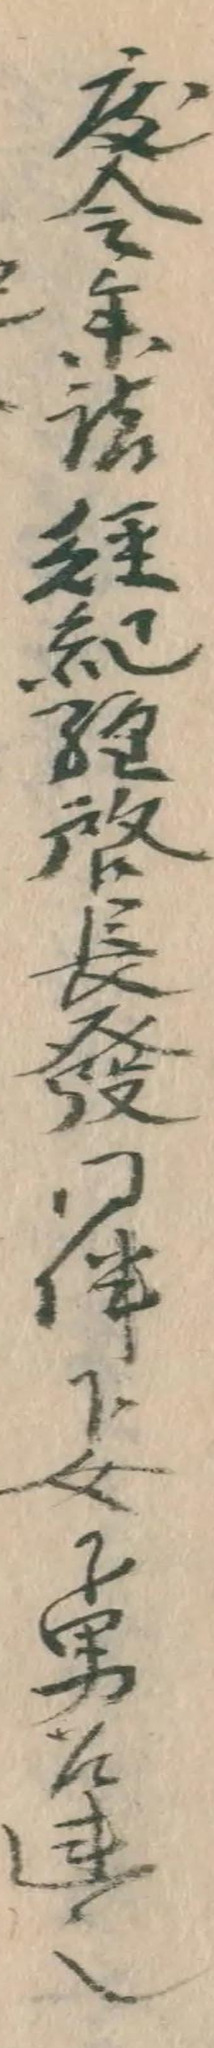度令参詣経紀経啓長発同伴下女下男召連也
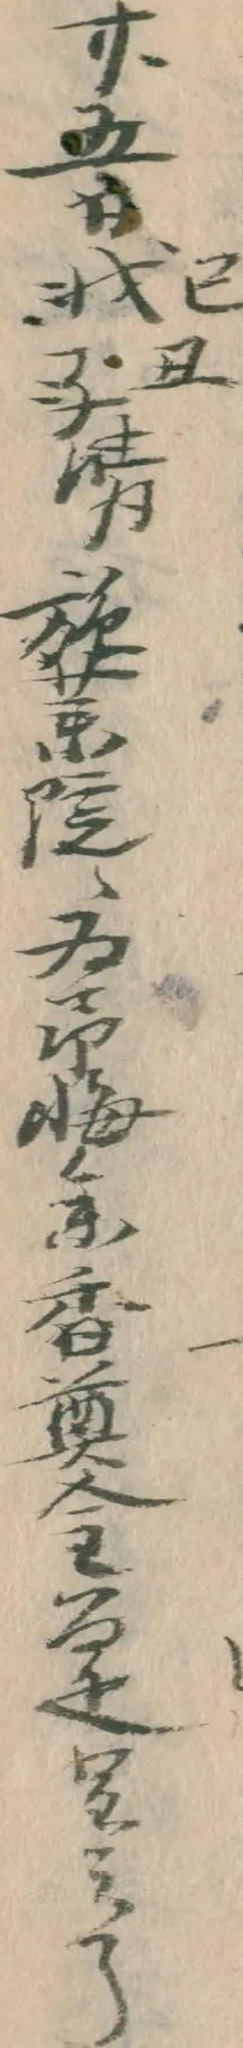廿五日己丑晴施薬院へ為弔悔参香奠金百疋送之了

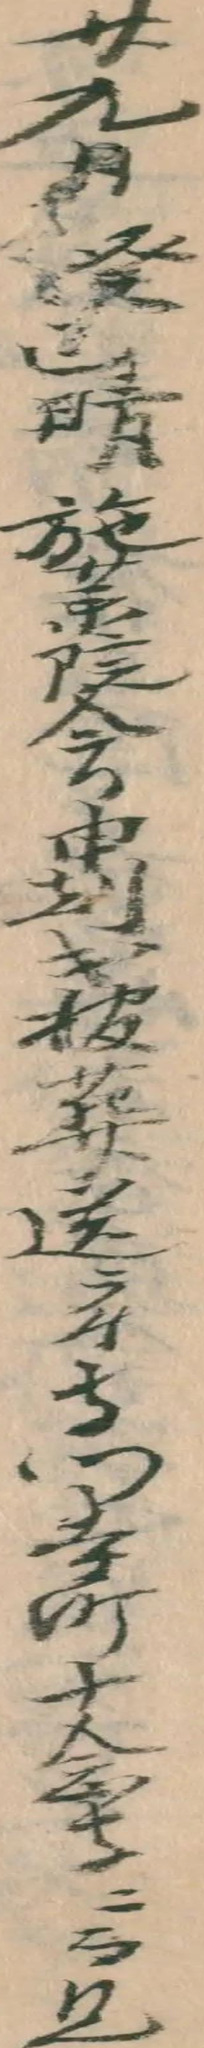廿九日癸巳晴施薬院今日申刻出棺葬送ニ付寺門寺町十念寺ニ而見
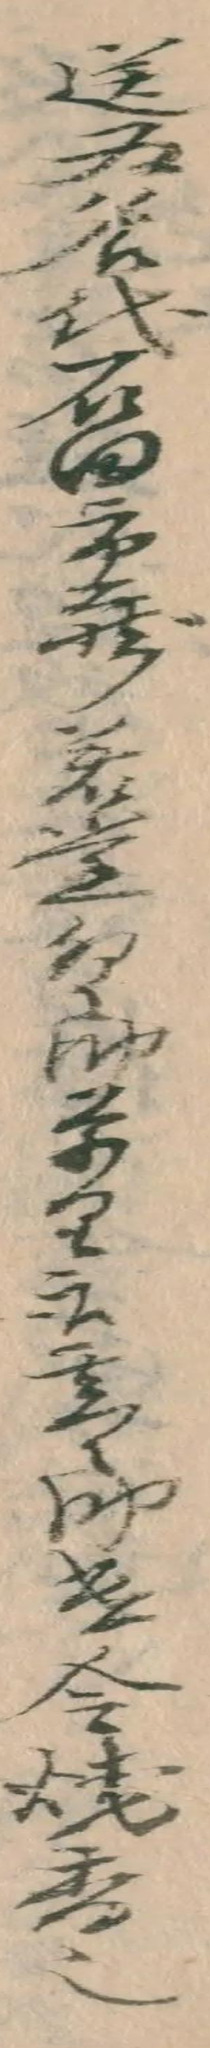送為名代石田市蔵若堂卯之助栄里取亥之助遣令焼香也
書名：賀茂社記録. 第69冊
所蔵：国立国会図書館 National Diet Library, JAPAN
